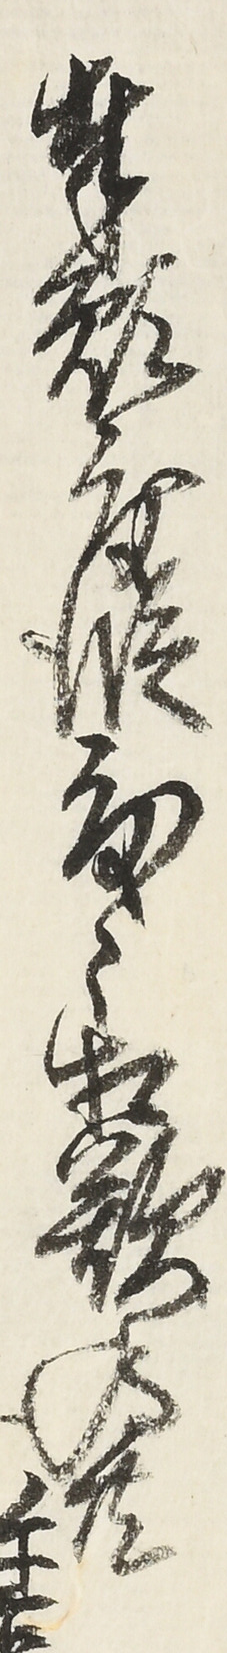奉願度段度々相歎候得共
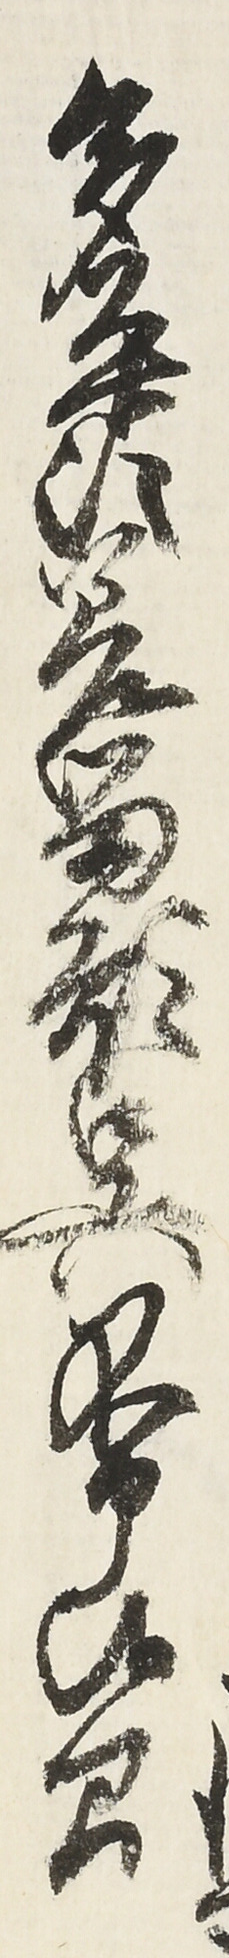多平治差留形呉不申候間
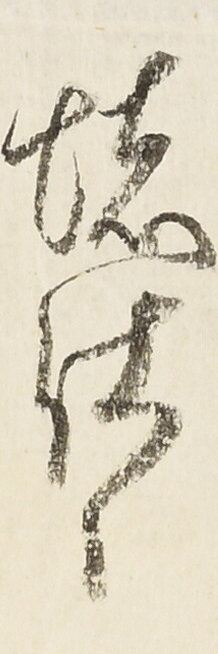堵仕候
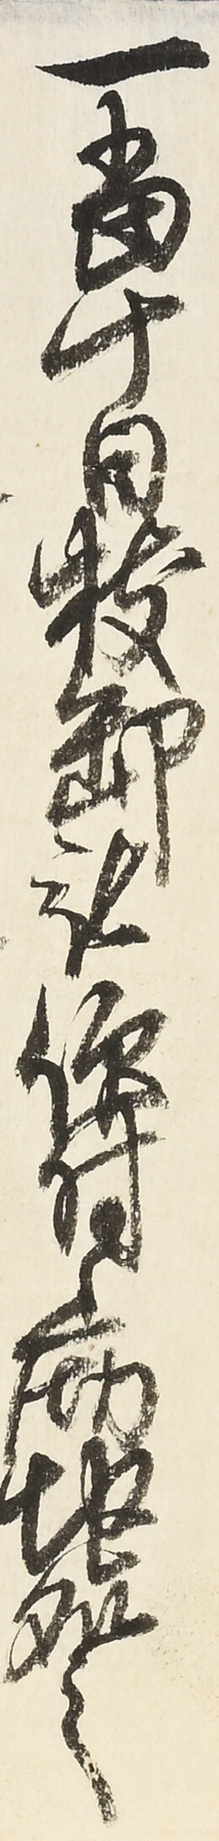一当十日枝卸被仰付働切地処之
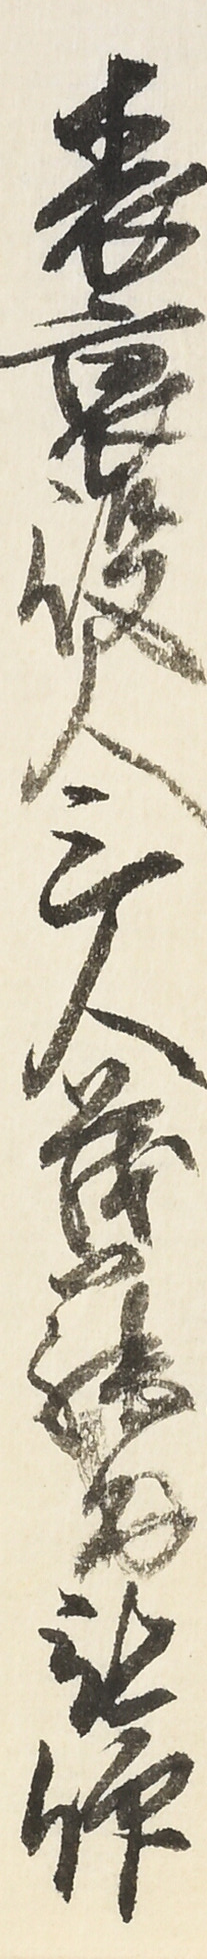表裏役人三人茂罷出被仰
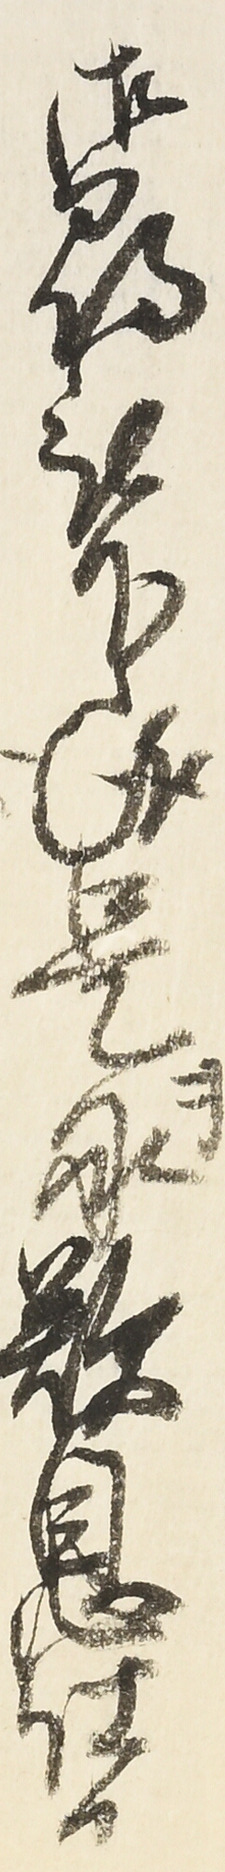御尋被下趣是ヲ永歎息仕候
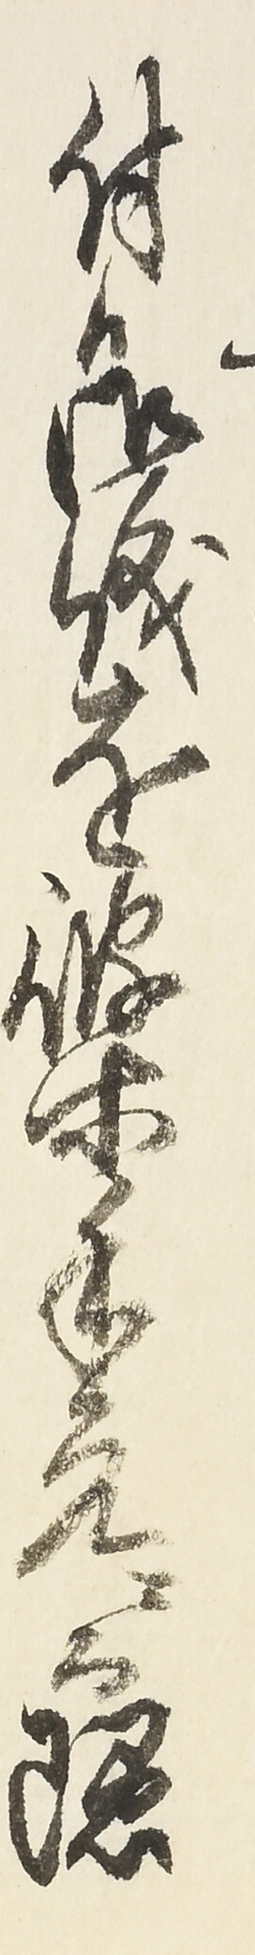付候御儀を彼等手元ニ而隠
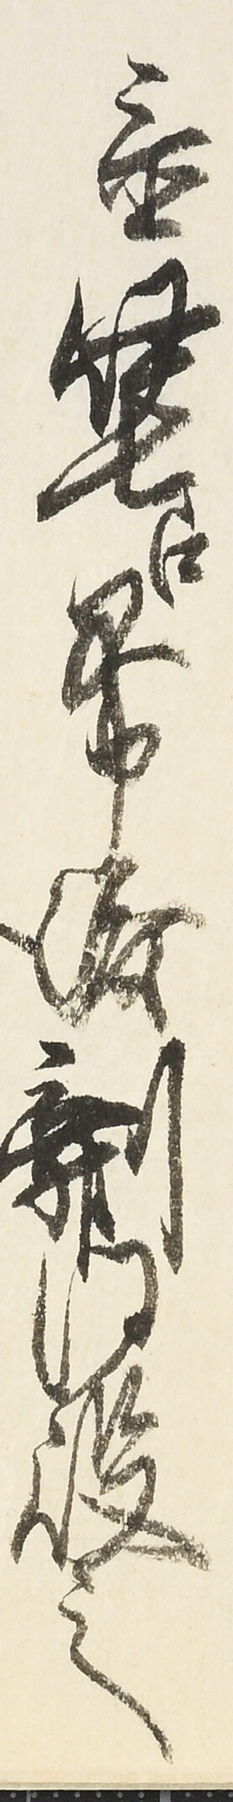置伊七江不申儀剰同役之
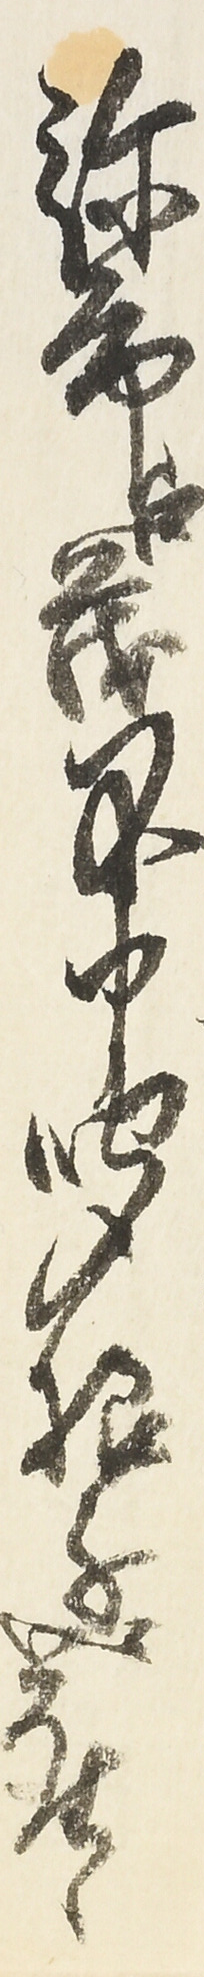弥市江茂不申聞様子御座候
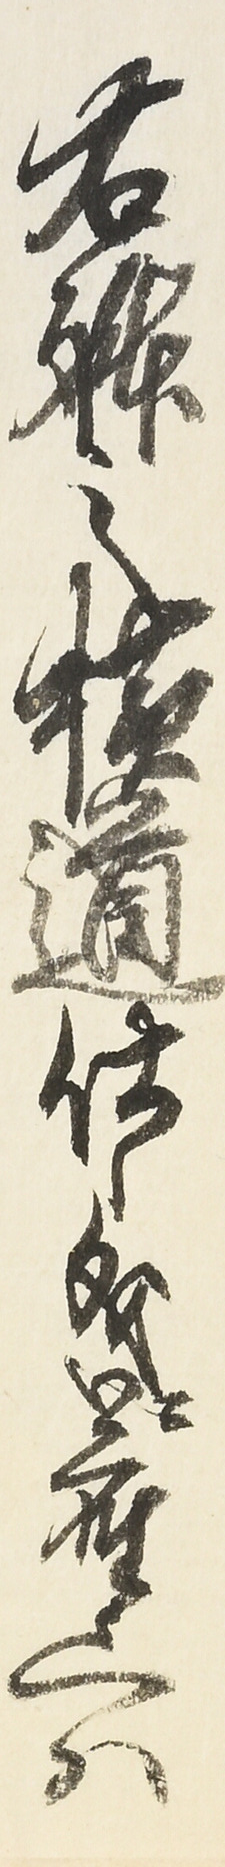右体之横道仕候義ニ御座候へハ
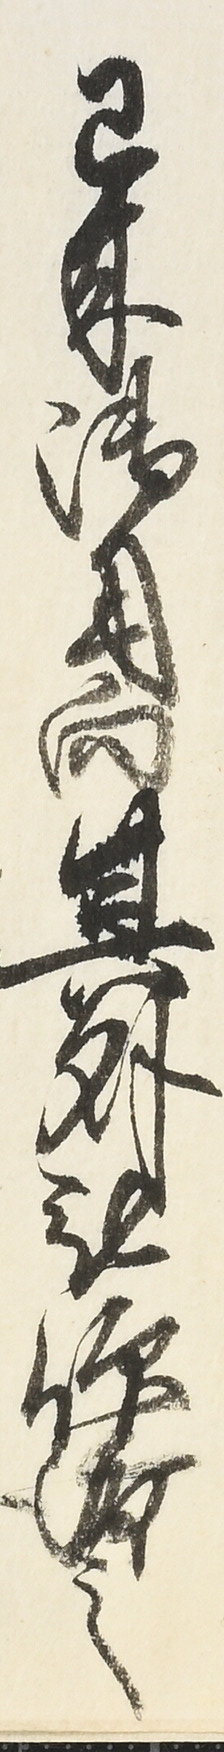已来御用向其外被仰付之
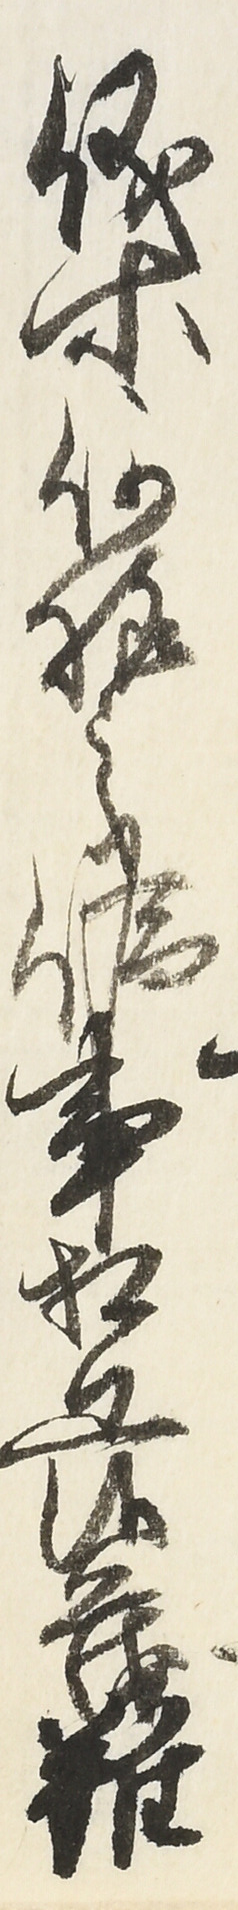儀等何様之偽事工候茂難

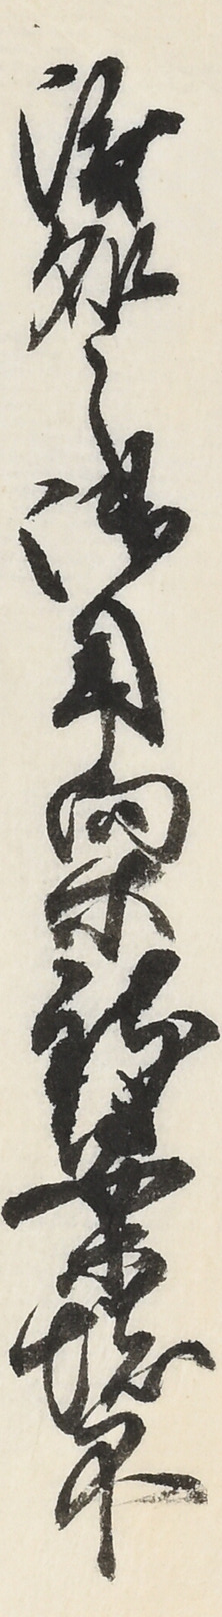儀処之御用向等致案堵不
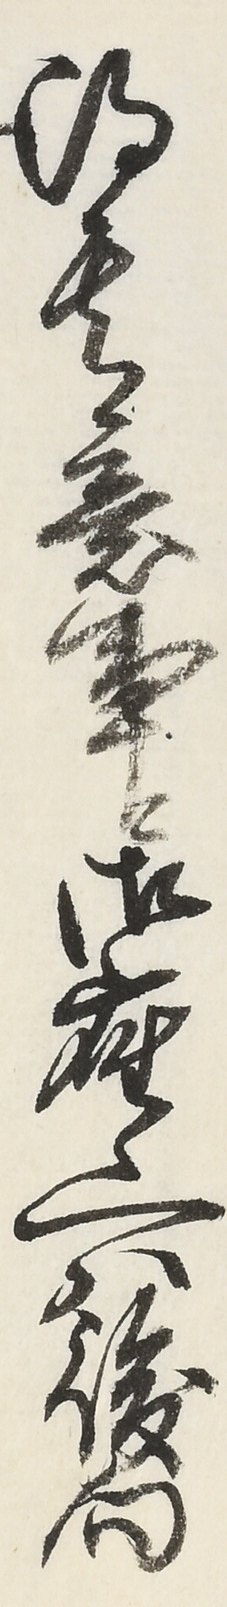得其意事ニ御座候へハ後向
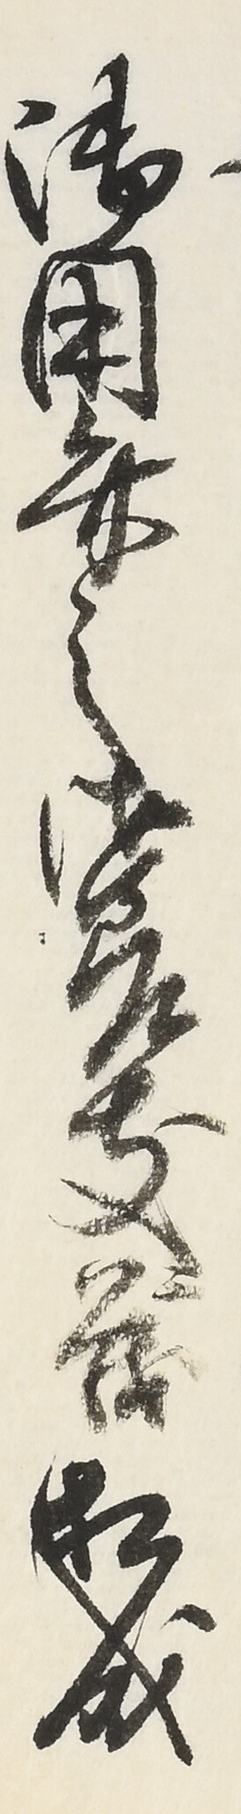御用弁之御差支ニ茂相成
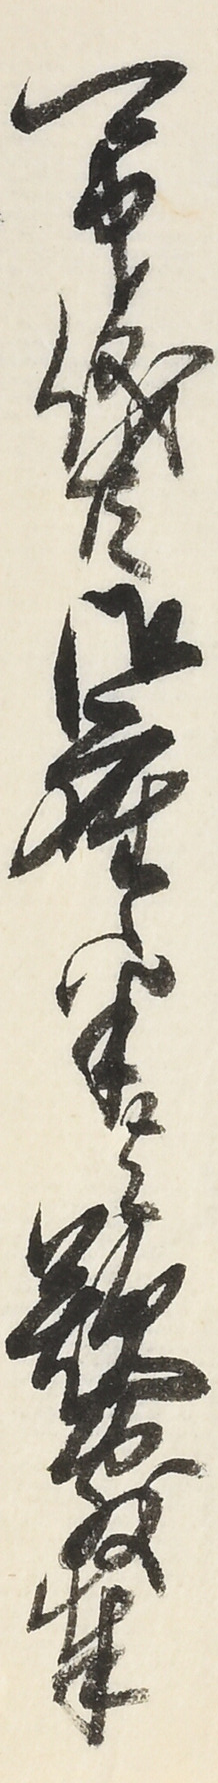可申儀共御座候半と歎敷奉
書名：乍恐御内々子委奉申上度口上書
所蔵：伊那市立高遠町図書館・合同会社AMANE
